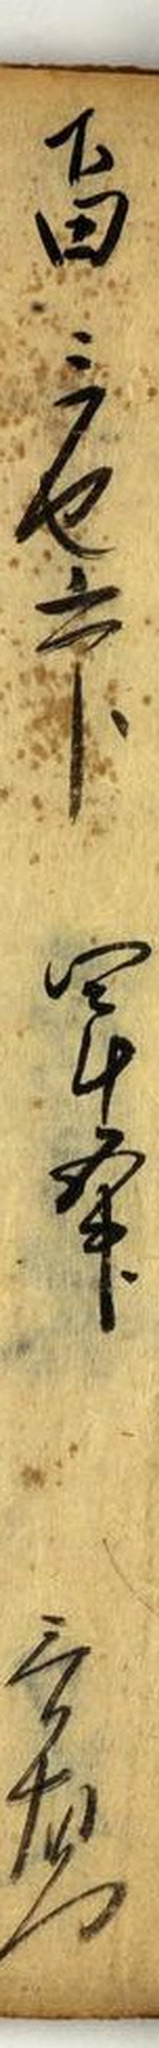下田三セ六分四斗五升三郎左衛門
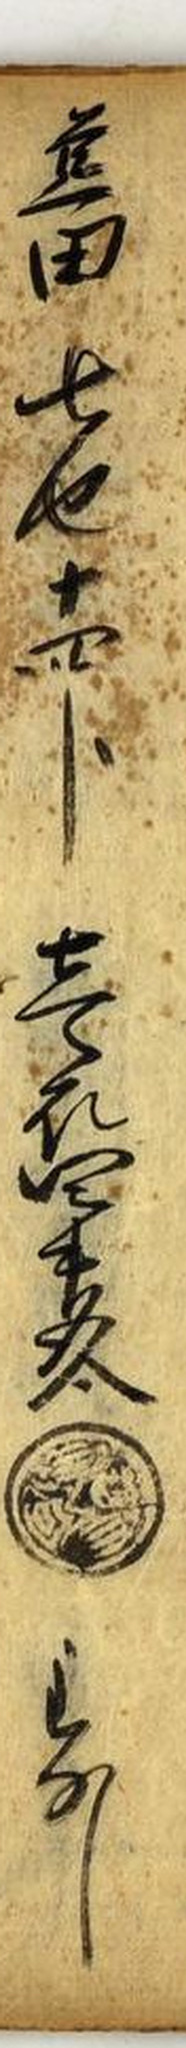荒田七セ十四分壱石四升五合㊞主なし
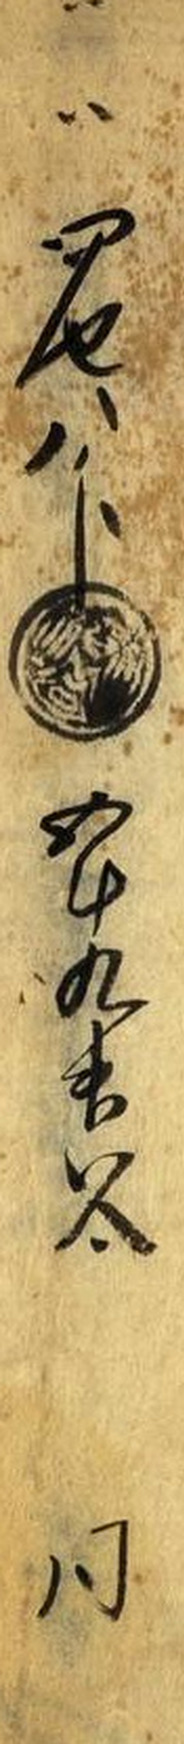同四セ八分㊞九斗九升八合同
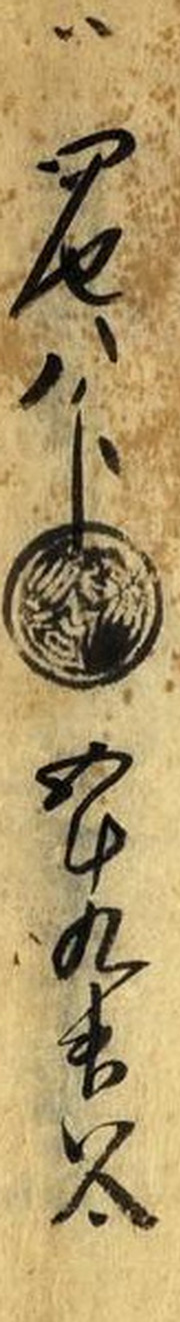同四セ八分㊞九斗九升八合同
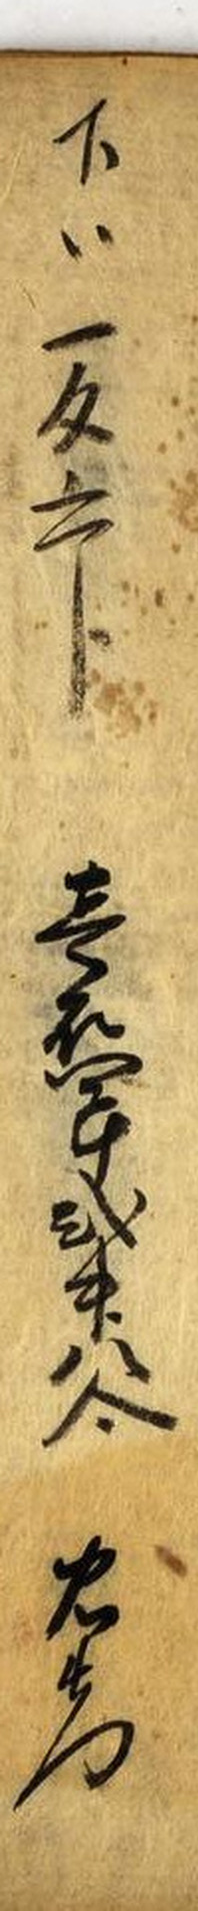下同一反六分壱石四斗弐升八合忠右衛門
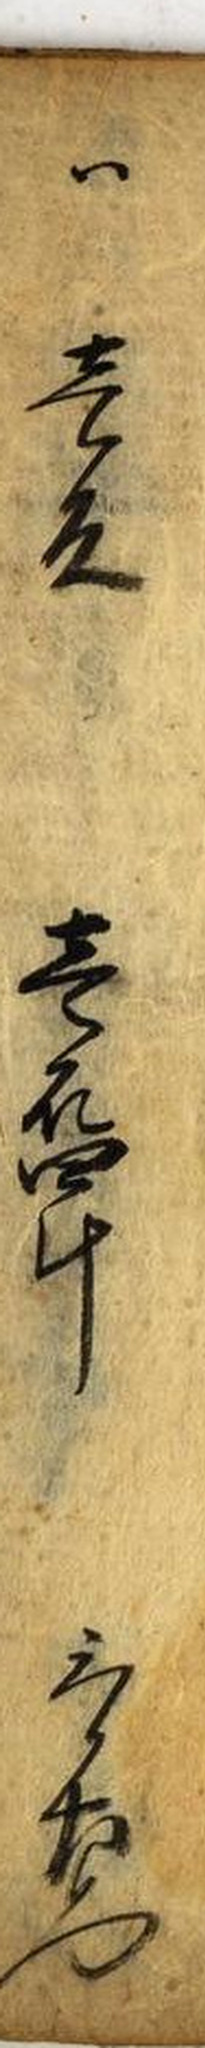同壱反壱石四斗三郎左衛門
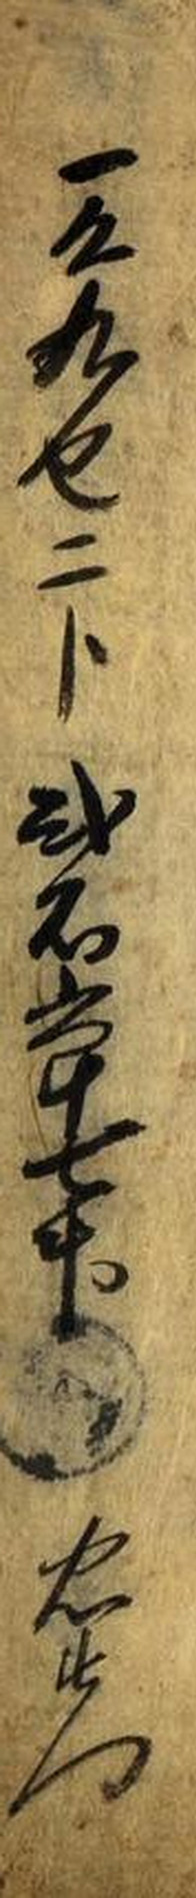同一反九セ二分弐石六斗七升㊞忠右衛門

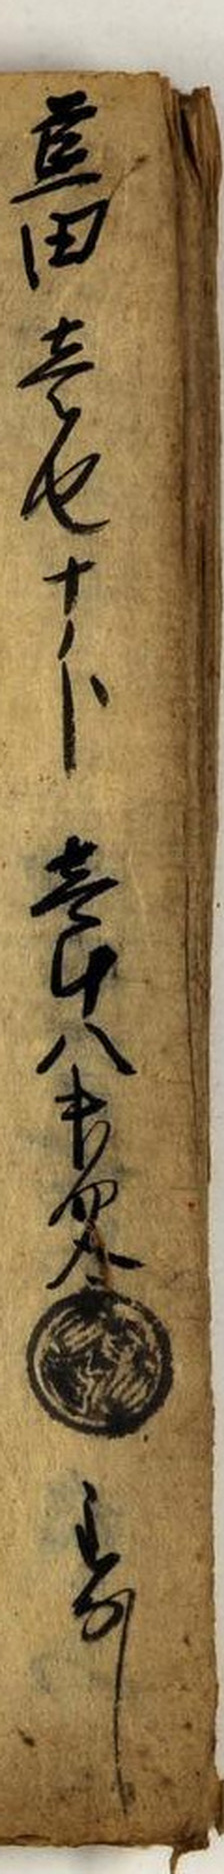荒田壱セ十分壱斗八升四合主なし
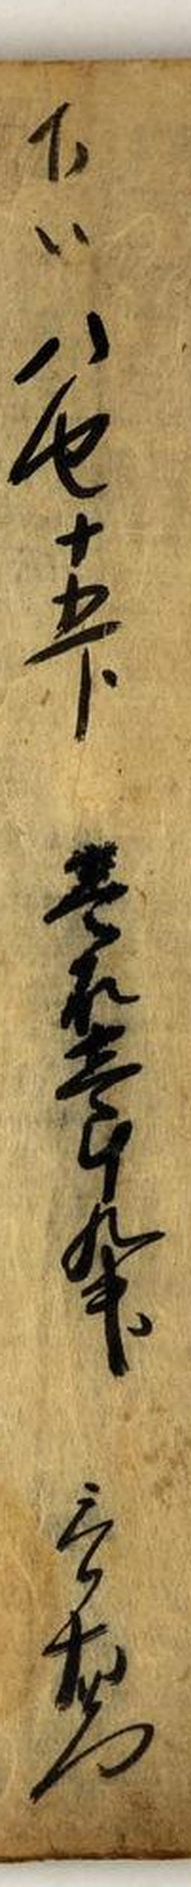下同八セ十五分壱石壱斗九升三郎左衛門
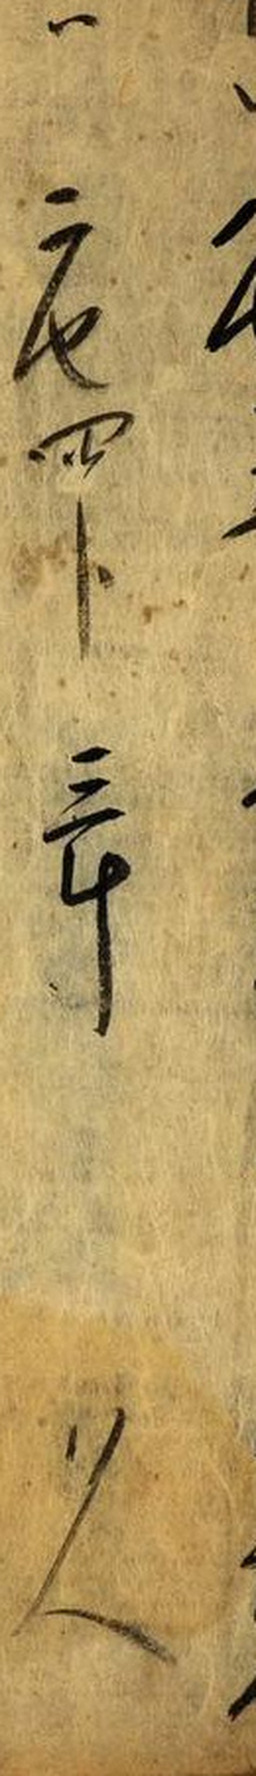同二セ四分三斗同人
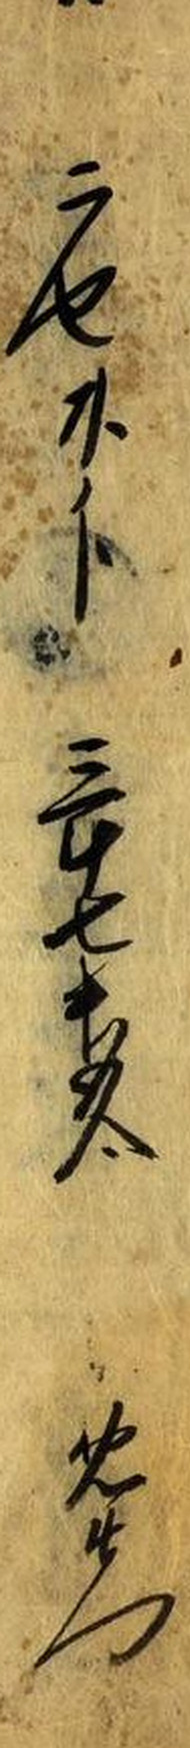同二セ廿分三斗七升五合忠右衛門
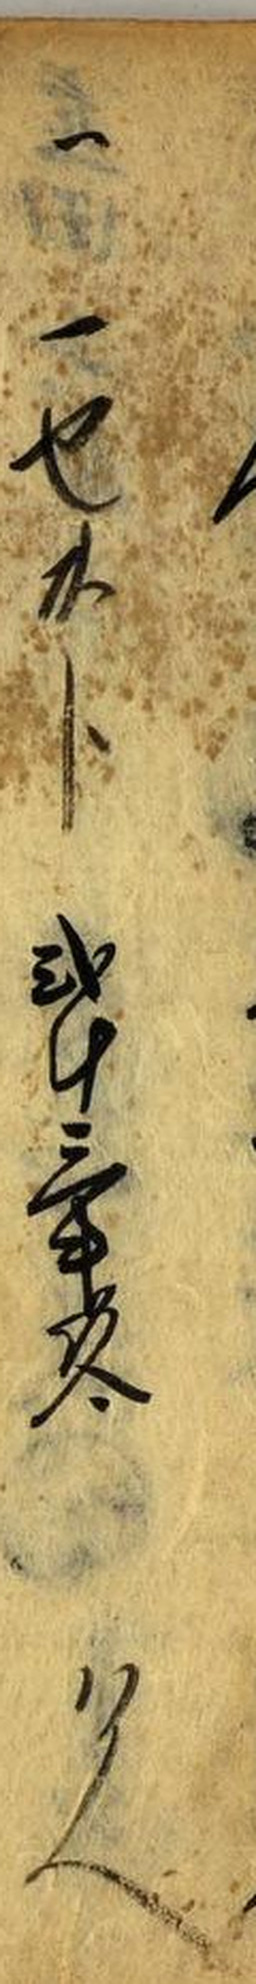同一セ廿分弐斗三升五合同人
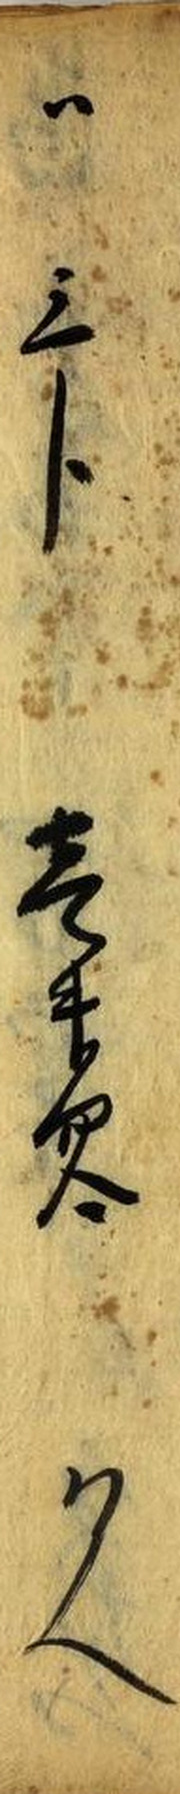同三分壱升四合同人
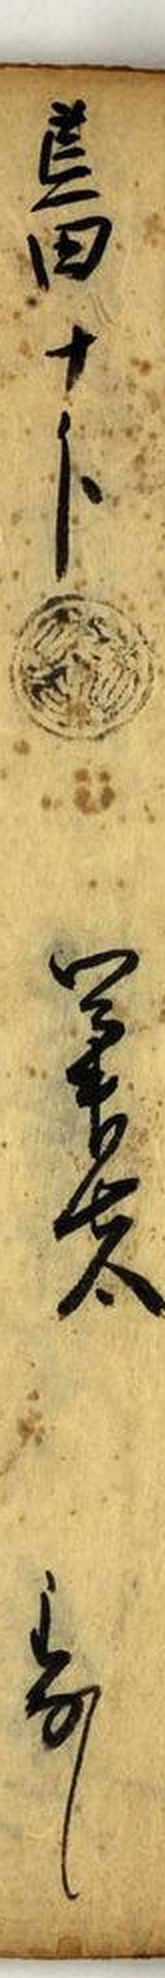荒田十分㊞四升七合主なし
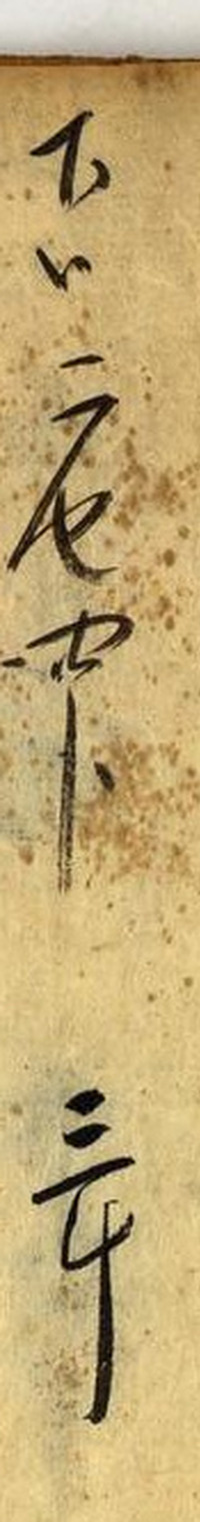同二セ四分三斗同人
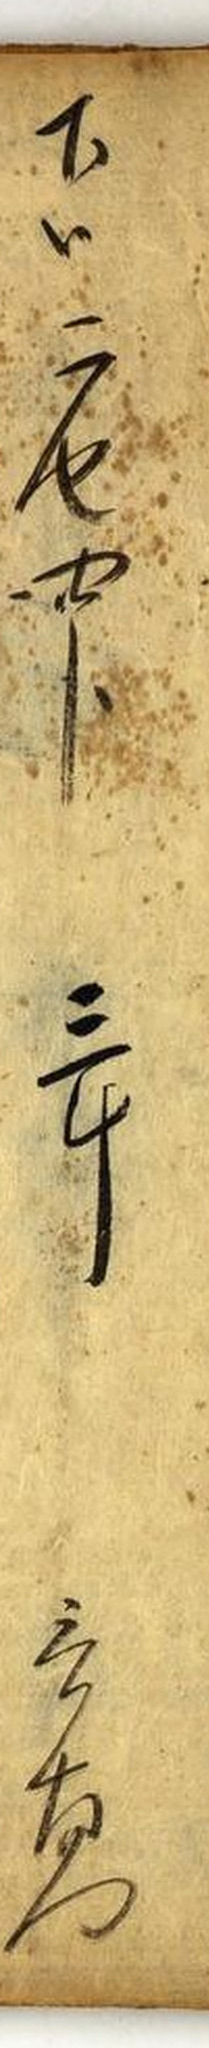下同二セ四分三斗三郎左衛門
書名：越前国西方内志津庄内本折村御検地帳
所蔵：福井県文書館 Fukui Prefectural Archives
